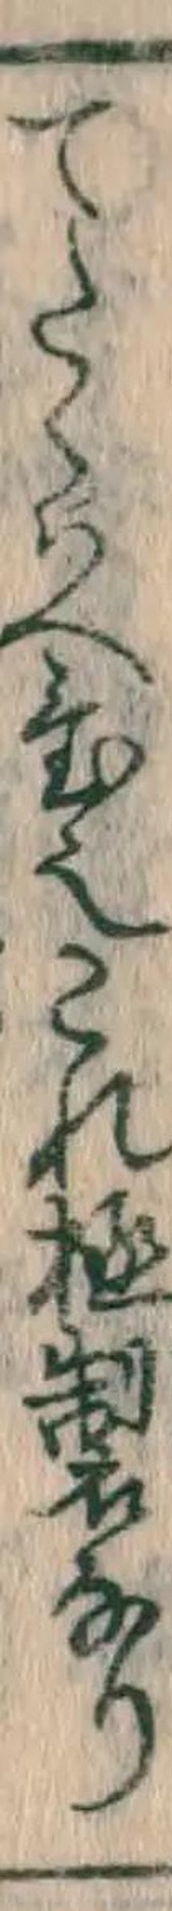てたくはへ置也これ極製なり
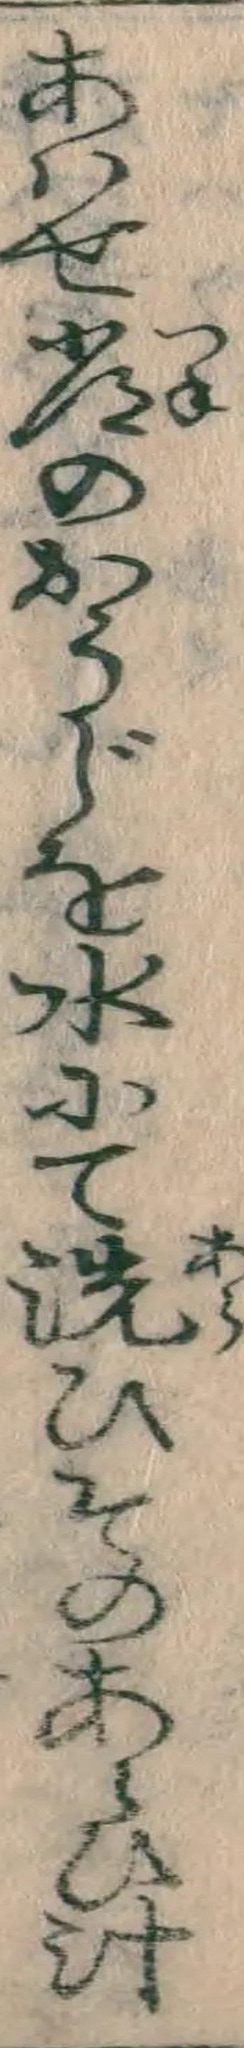あはせ常のかうじを水にて洗ひそのあらひ汁
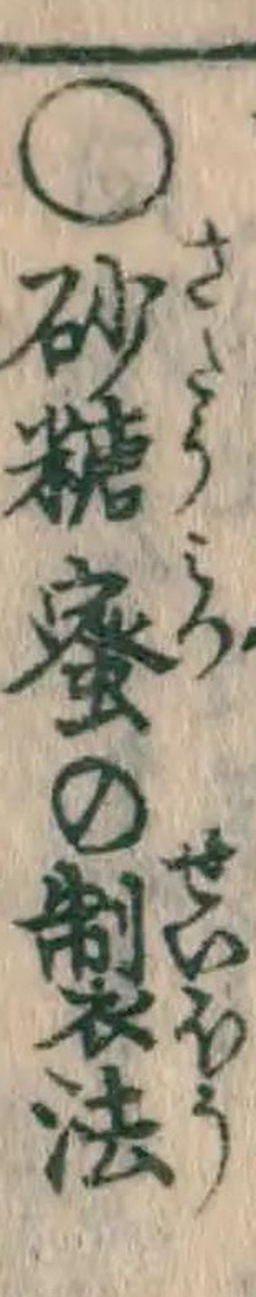○砂糖蜜の製法
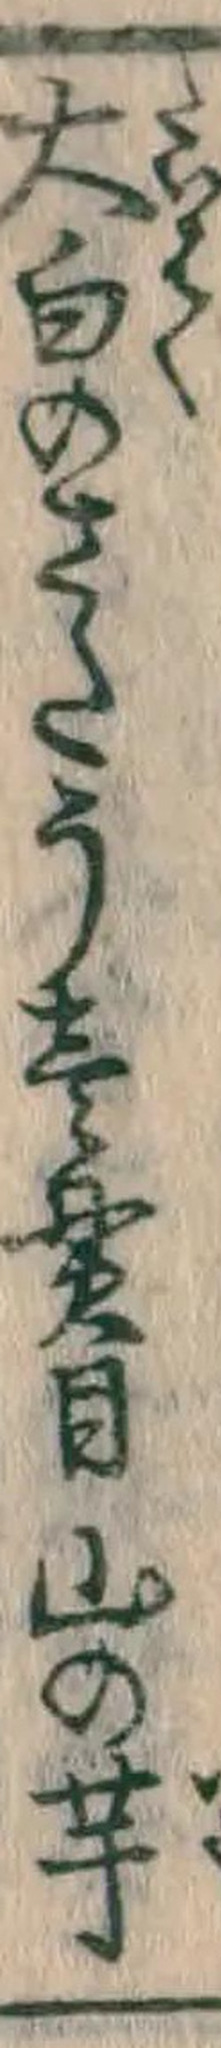大白のさたう壱貫目山の芋
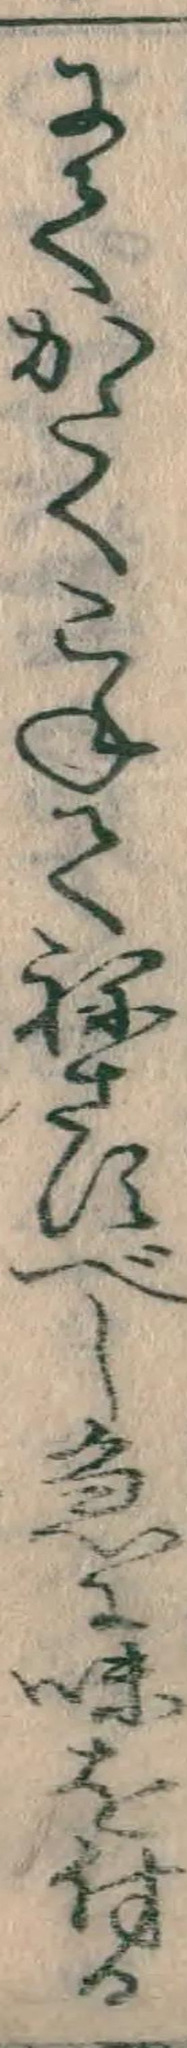にてかたくこねてねさすべし急に味を付る
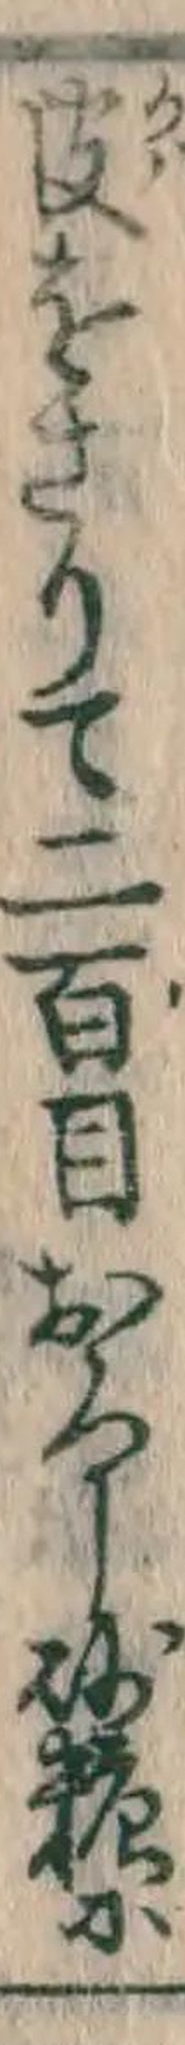皮をさりて二百目おろし砂糖に
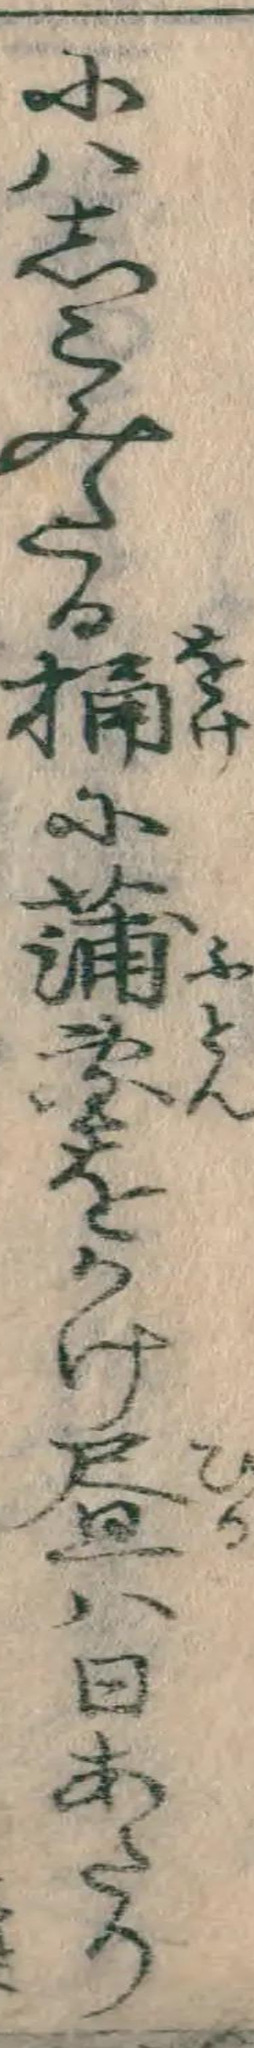にはしこみたる桶に蒲団をかけ昼は日あたり
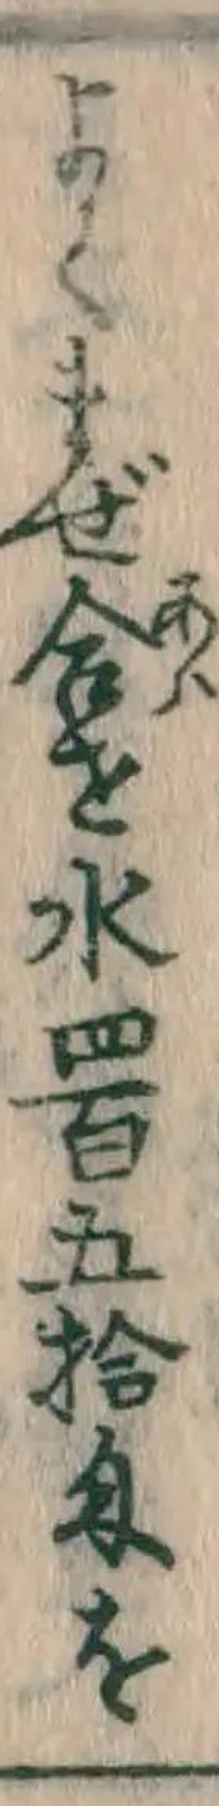よくまぜ合せ水四百五拾匁を
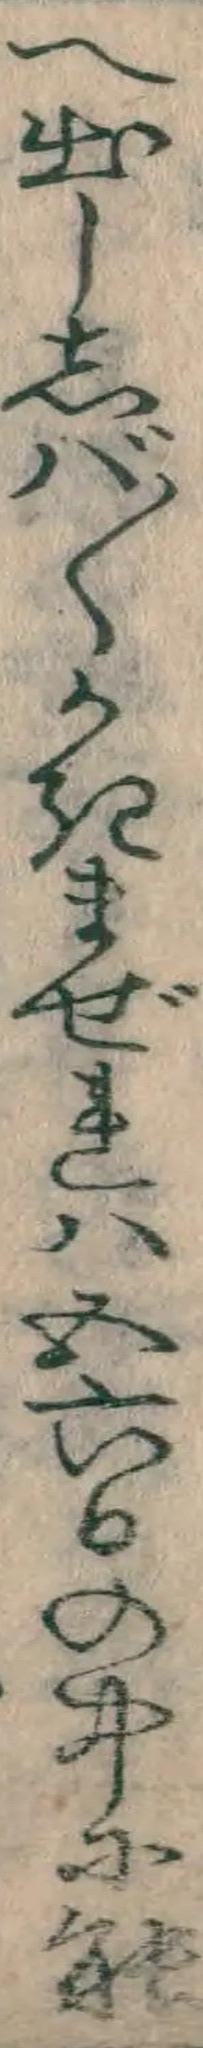へ出ししば〳〵かきまぜれは五六日の中に能
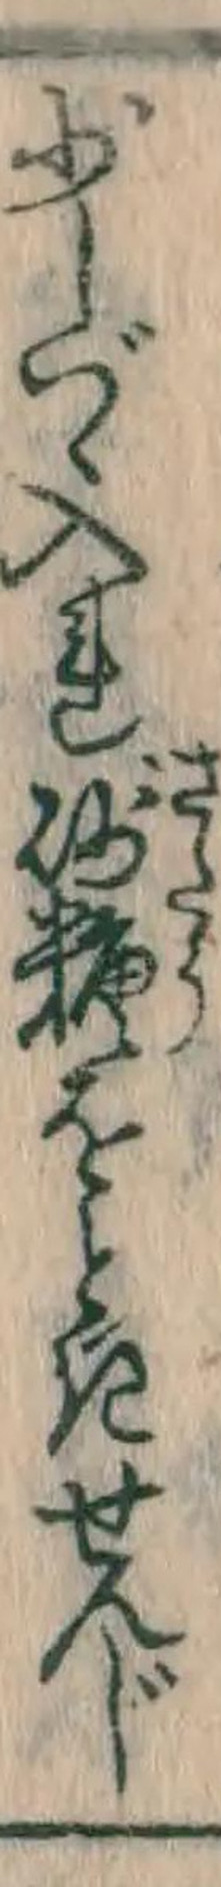少しづゝ入れ砂糖をときせんじ
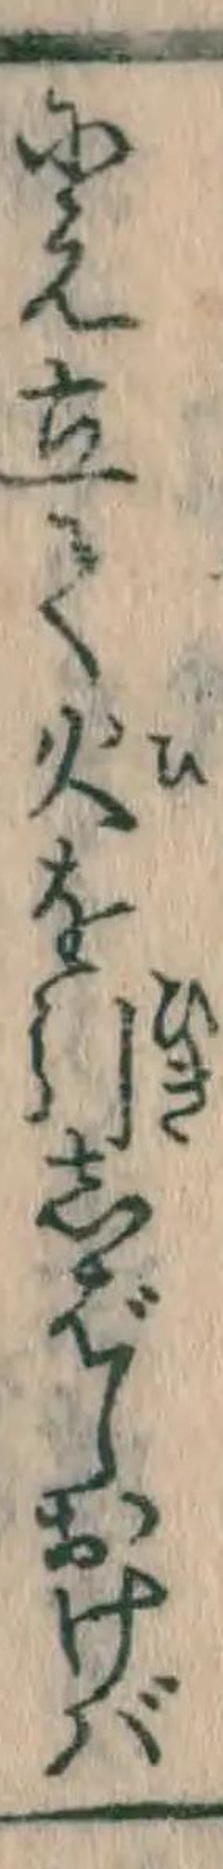にえ立て火を引しばしおけば
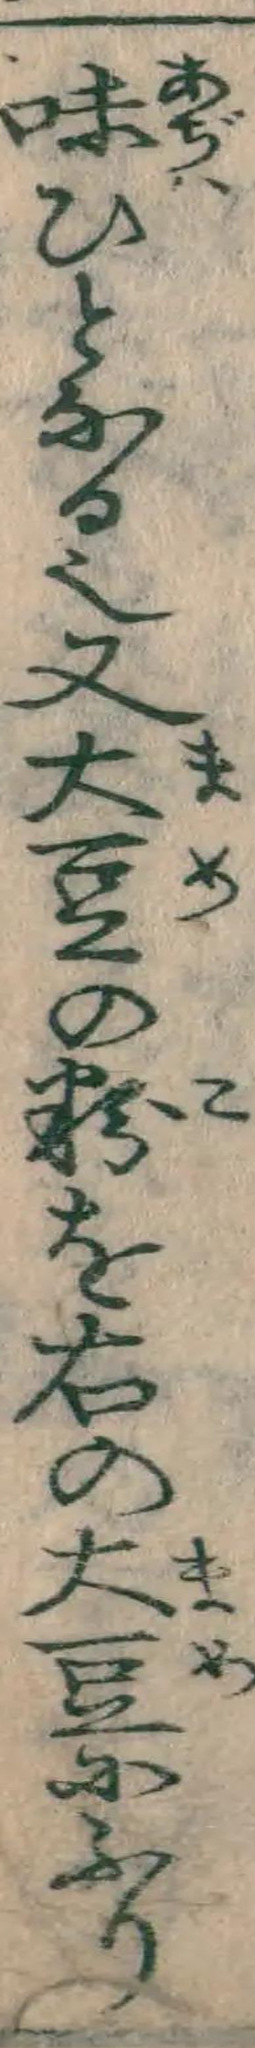味ひとなる也又大豆の粉を右の大豆にふり

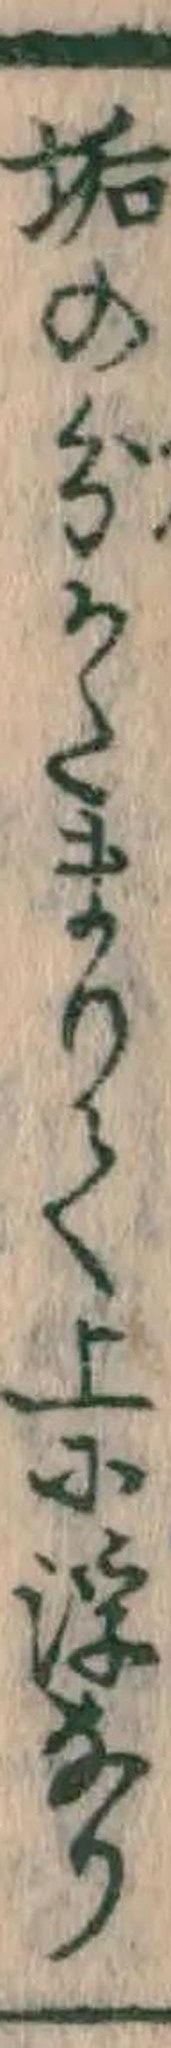垢の分かたまりて上に浮なり
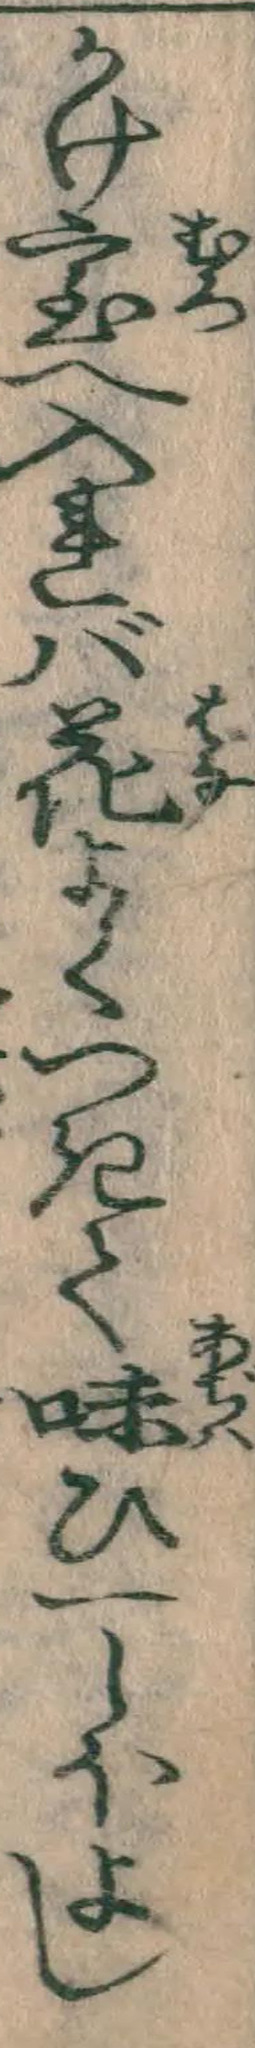かけ室へ入れば花よくつきて味ひ一しほよし
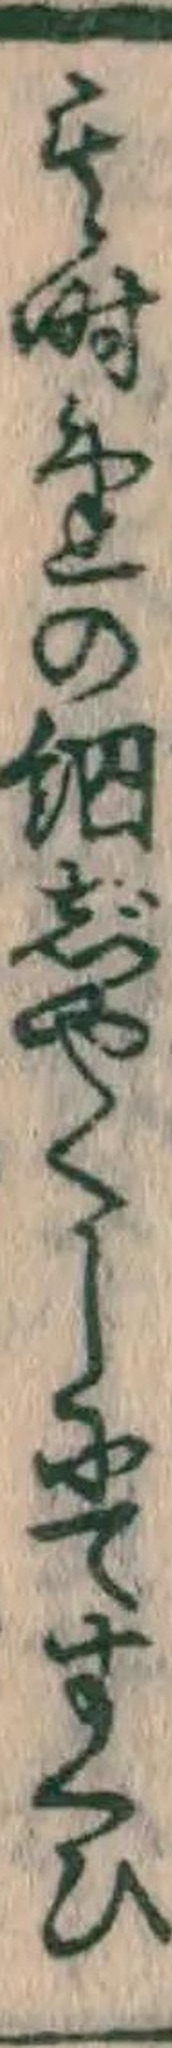其時金の網じやくしにてすくひ
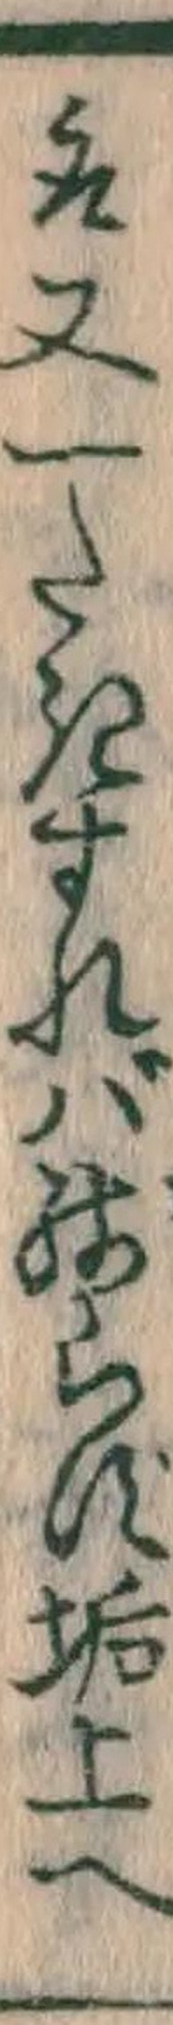取又一たきすれば残らず垢上へ
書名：広益秘事大全 3巻. [5]
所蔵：国立国会図書館 National Diet Library, JAPAN
